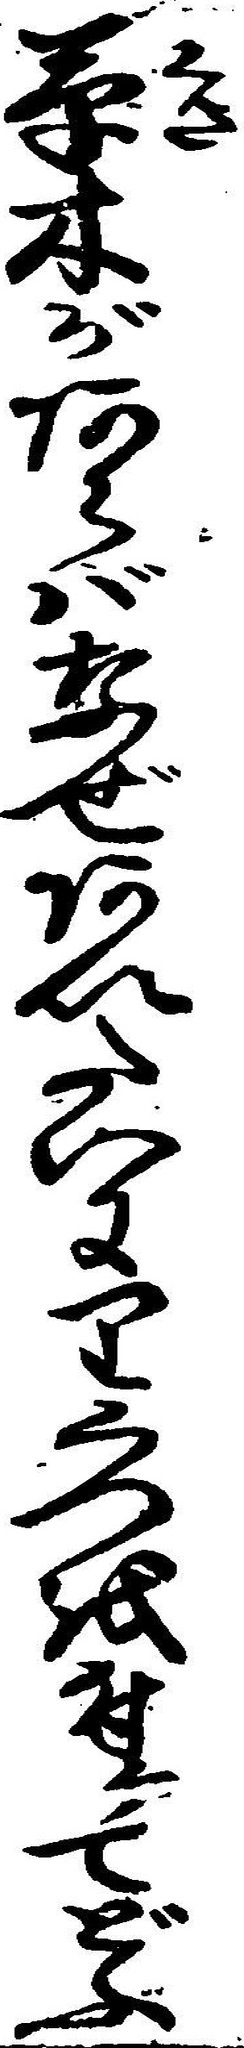草木があらばなぜあいたいにりくつを付てどふ
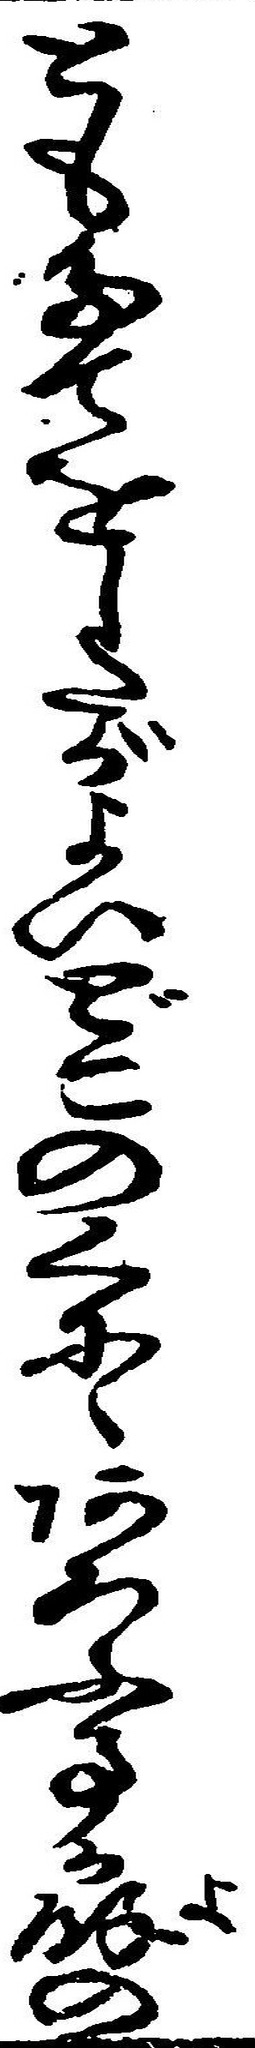ともたてをしたがよいどこのくにゝあろふ事か余の
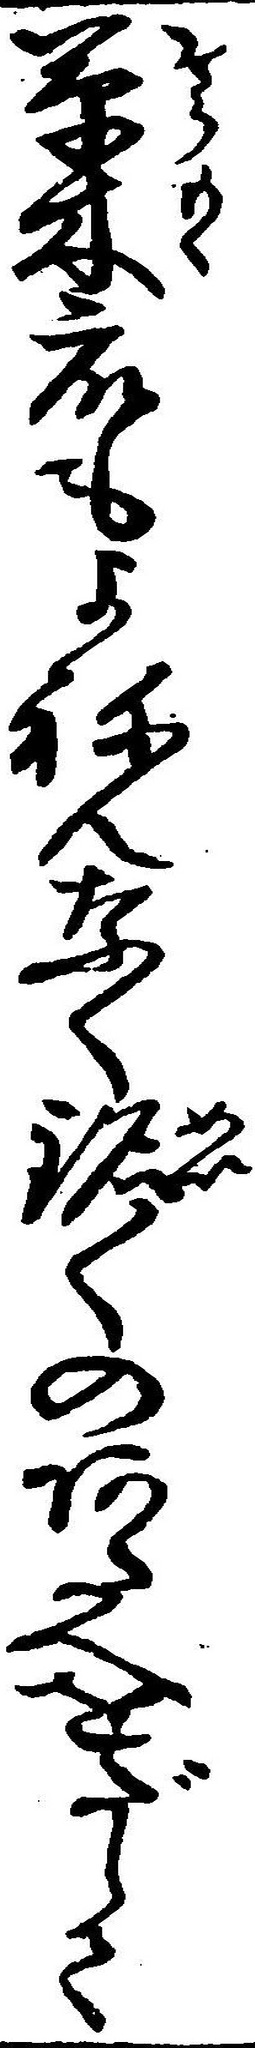草木衆もよねんなく銘々のあたへをだして
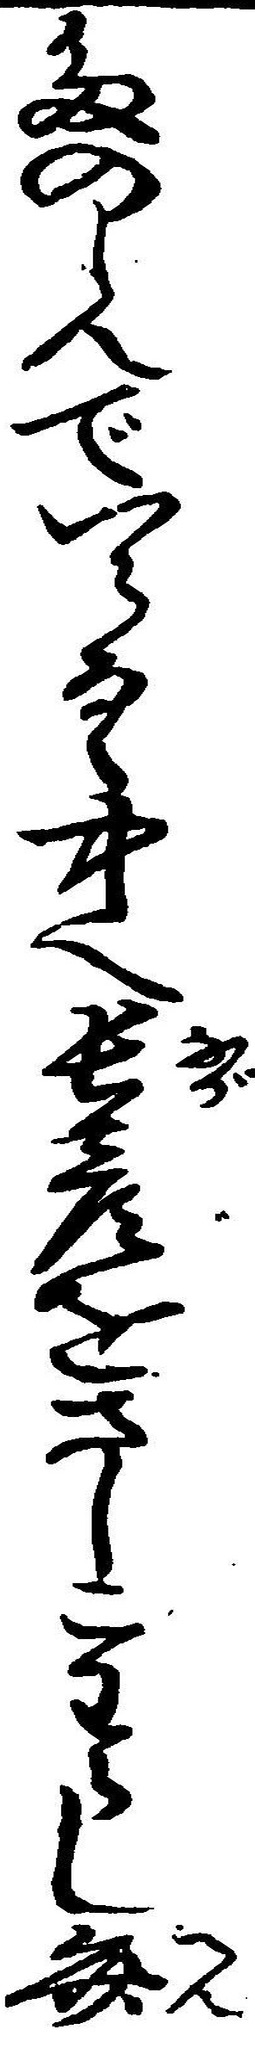たのしんでいらるゝ中へ長彦をさしこわらし弁
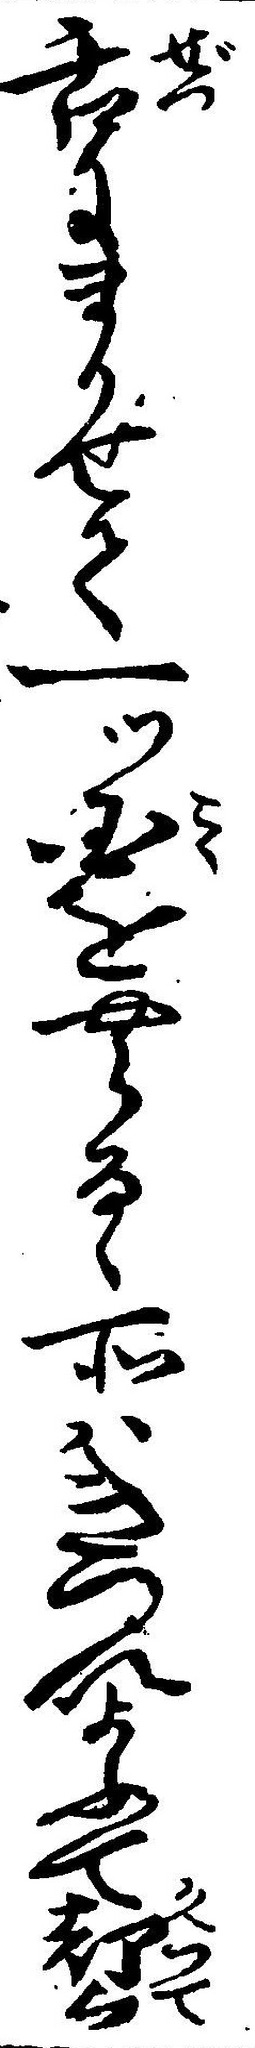舌にまかせて一ッ国をやらるゝ所はきついよふて却而
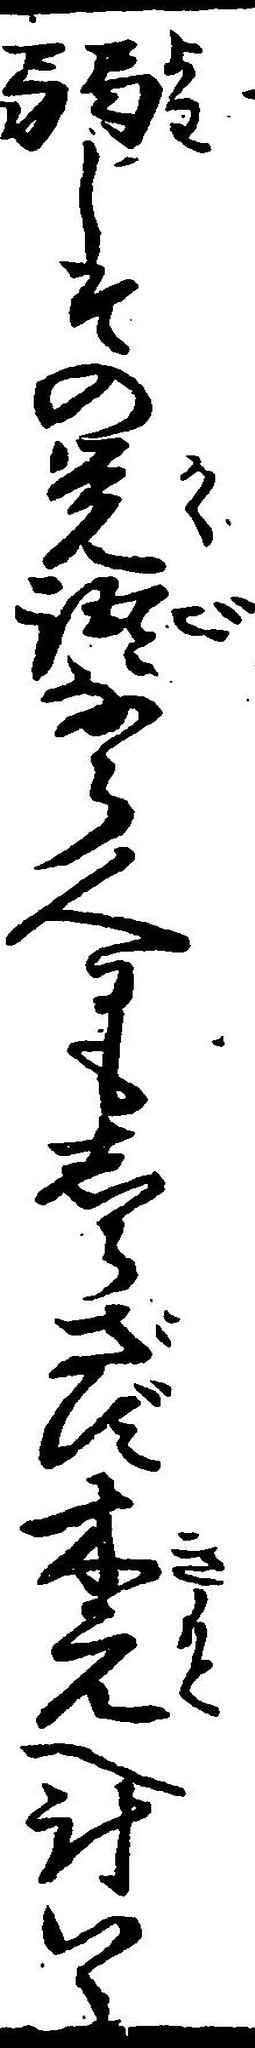弱しその覚悟なら人にもしらざず木元へ計いゝ
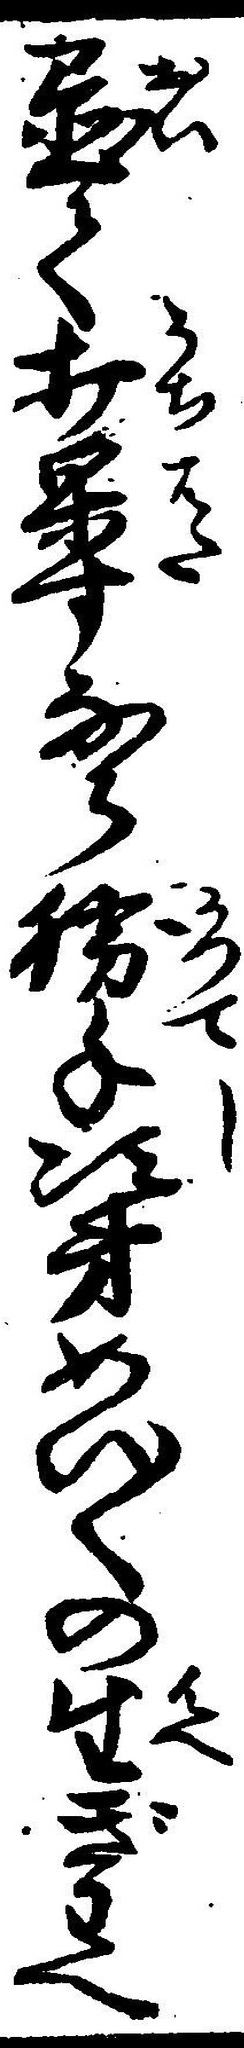置て打果すなら勝手次第めい〳〵の生ぎわへ

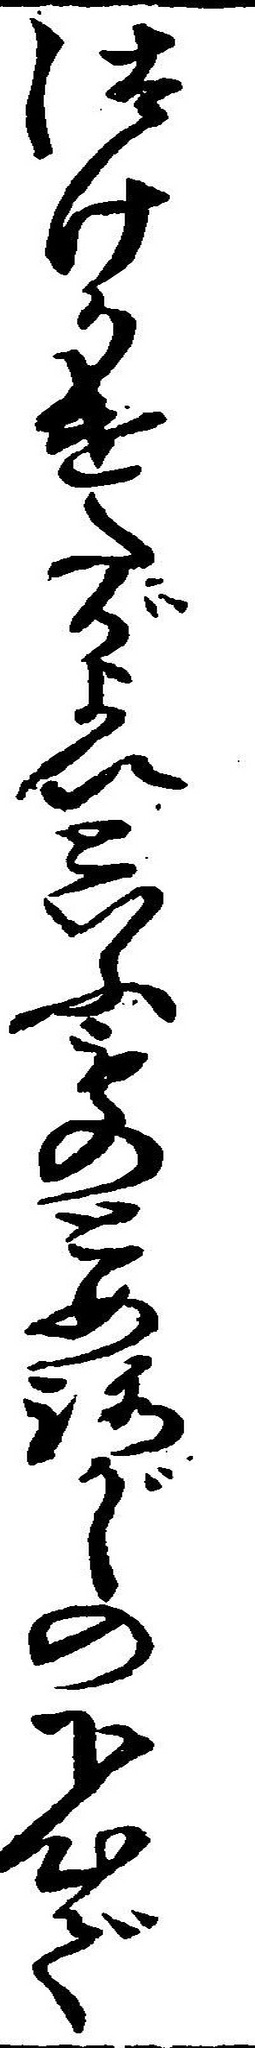つけかけたがよいといふものとめろがしの下心で
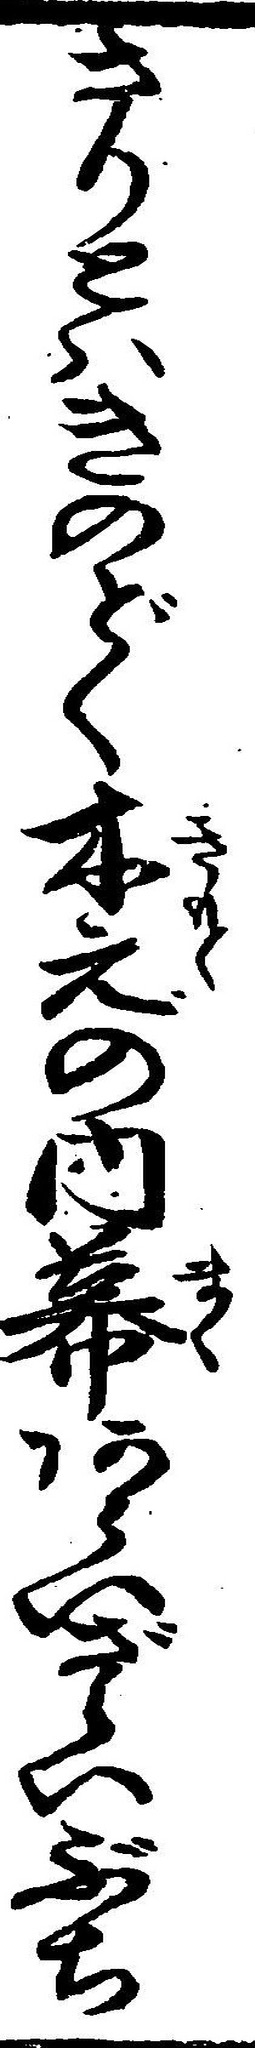さりとはきのどく木元の内幕あらいざらいぶち
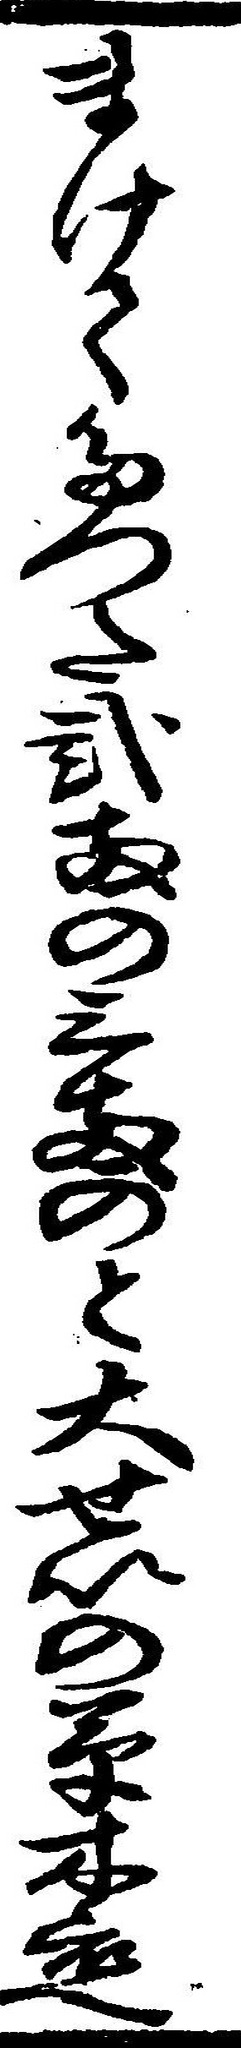まけてたつた弐両の三両のと大せいの草木衆へ
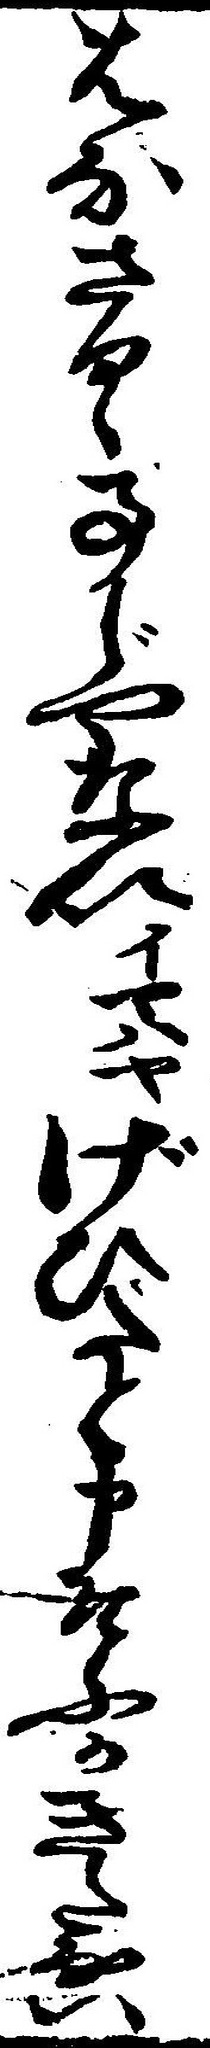はなさるゝ事じやないイヤハヤげびたと申そふかきたない
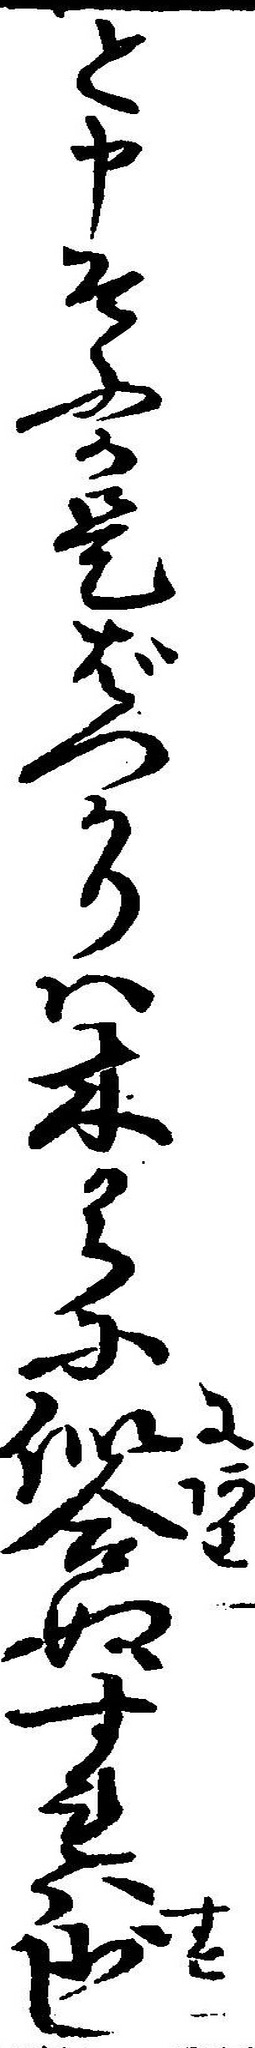と申そふか是ばつかりは木からに似合ぬすれは少し
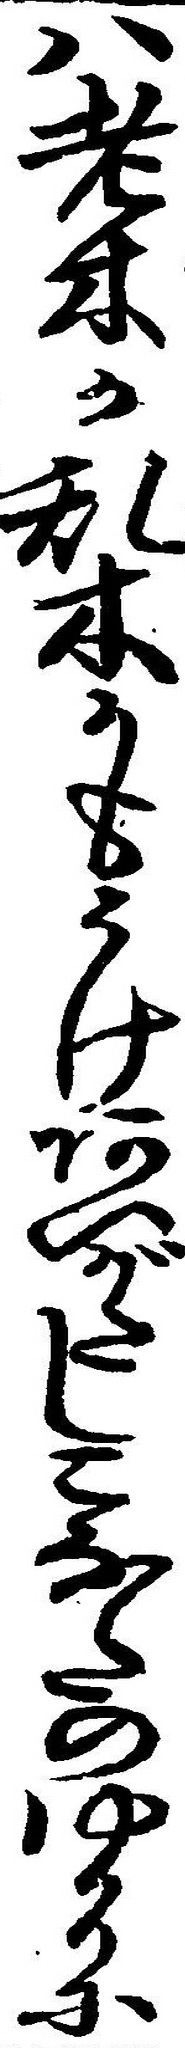は老木か乱木かもうけあいがたしこなたのゆかりに
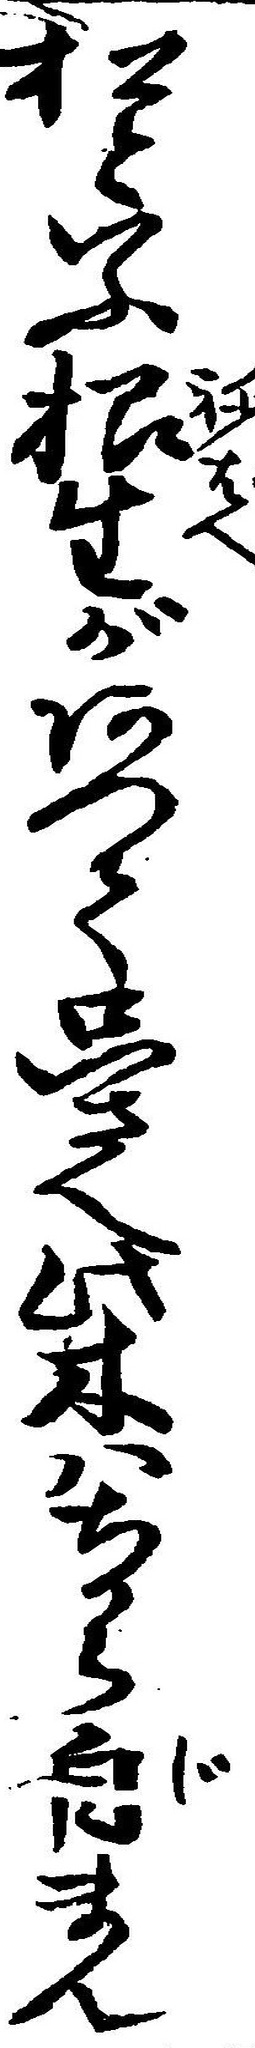松といふ根生があつて只さへ此木はちから自まん
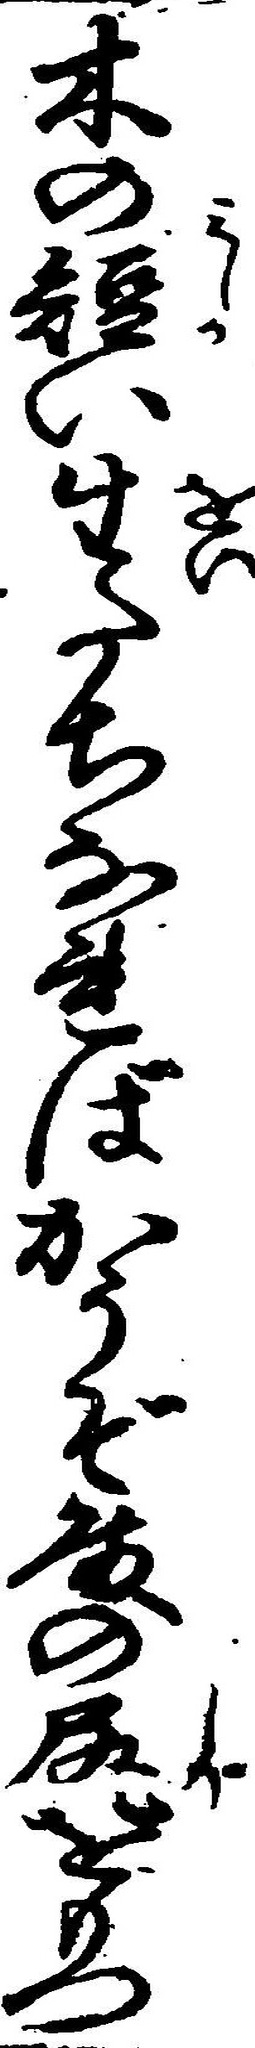木の短い生たちなればかうぞ殿の尻をもつ
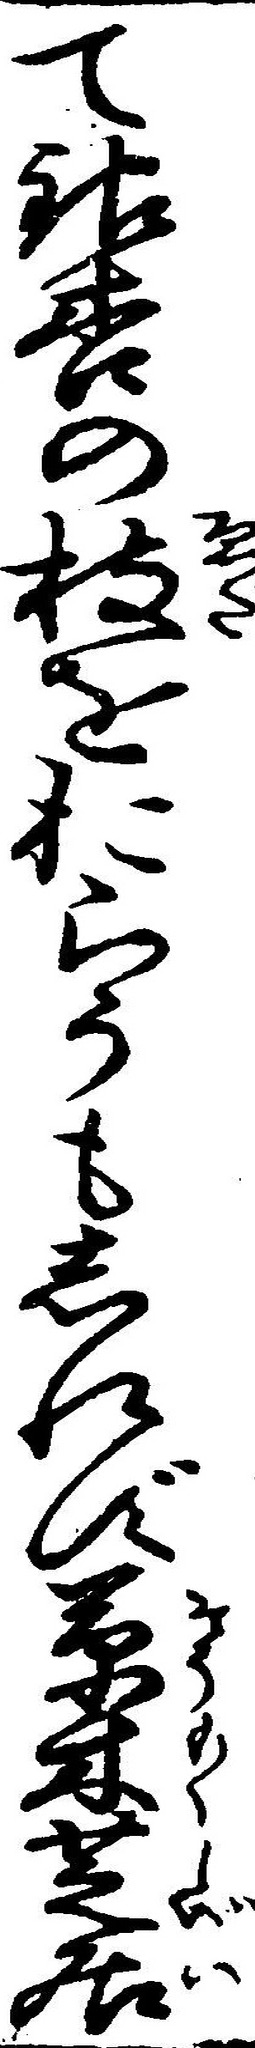て銀杏の枝をおらうもしれず草木芝居
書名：草木芝居化物退治 / 泉花堂三蝶(十六兵衛)作
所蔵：東京大学総合図書館 General Library in the University of Tokyo, JAPAN
